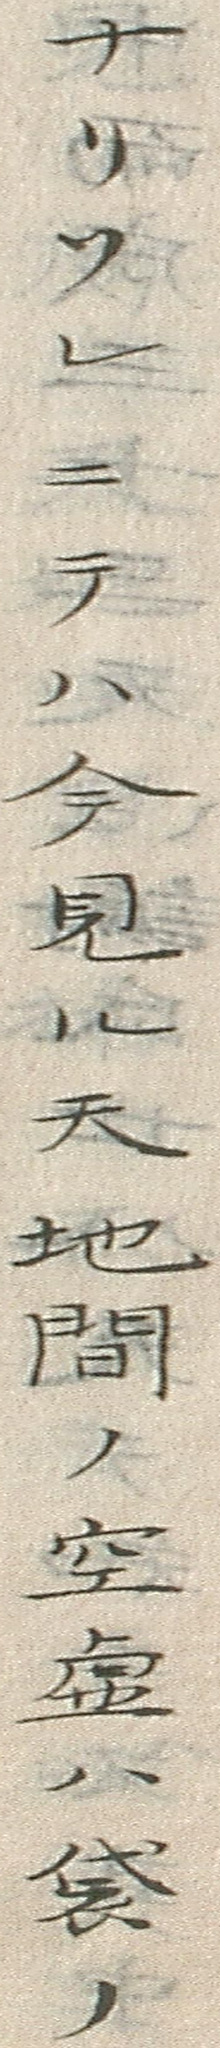ナリソレニテハ今見ル天地間ノ空虚ハ袋ノ
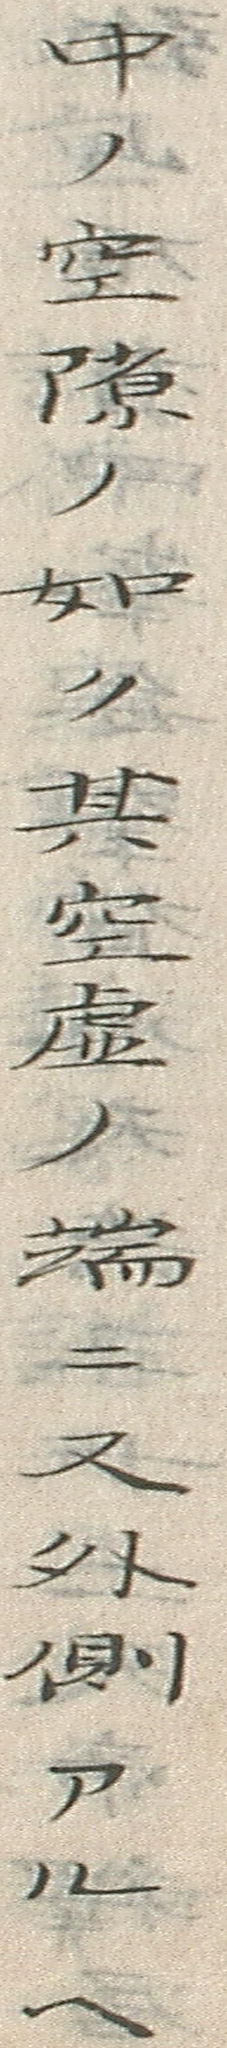中ノ空隙ノ如ク其空虚ノ端ニ又外側アルヘ
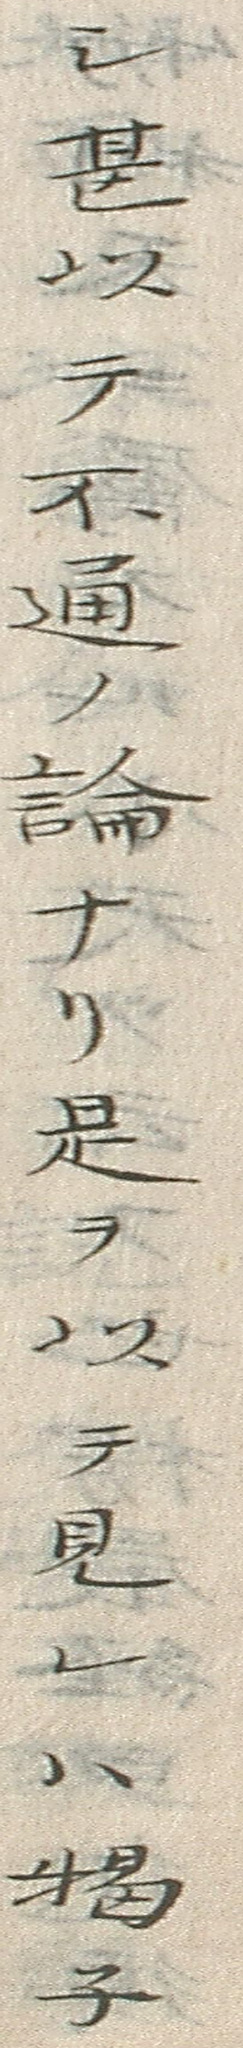シ甚以テ不通ノ論ナリ是ヲ以テ見レハ掲子
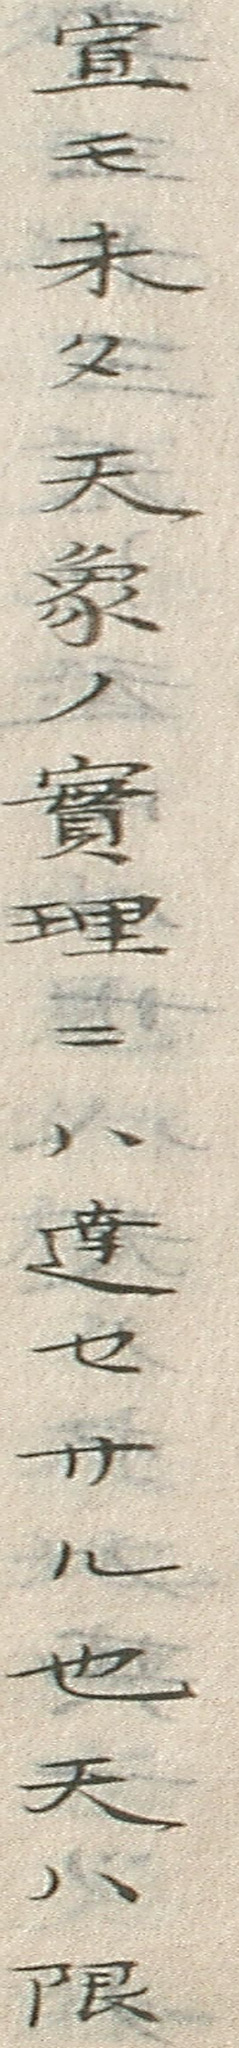宣モ未タ天象ノ実理ニハ達セサル也天ハ限
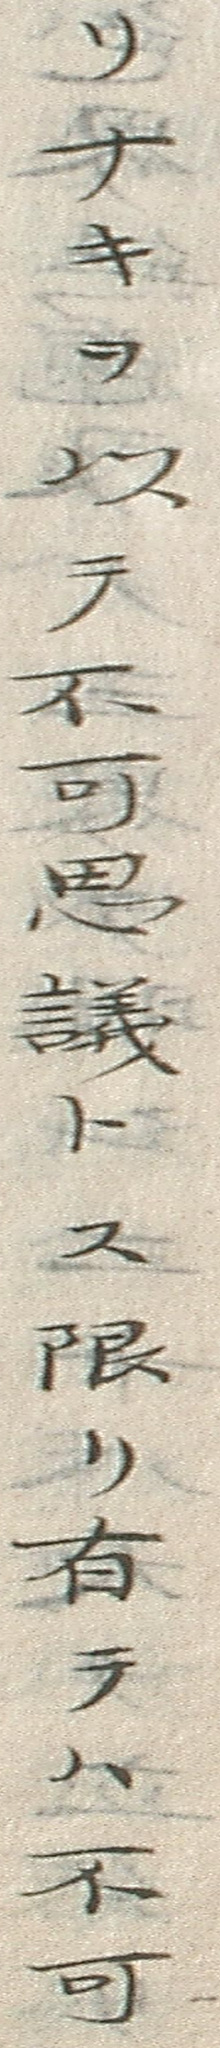リナキヲ以テ不可思議トス限リ有テハ不可
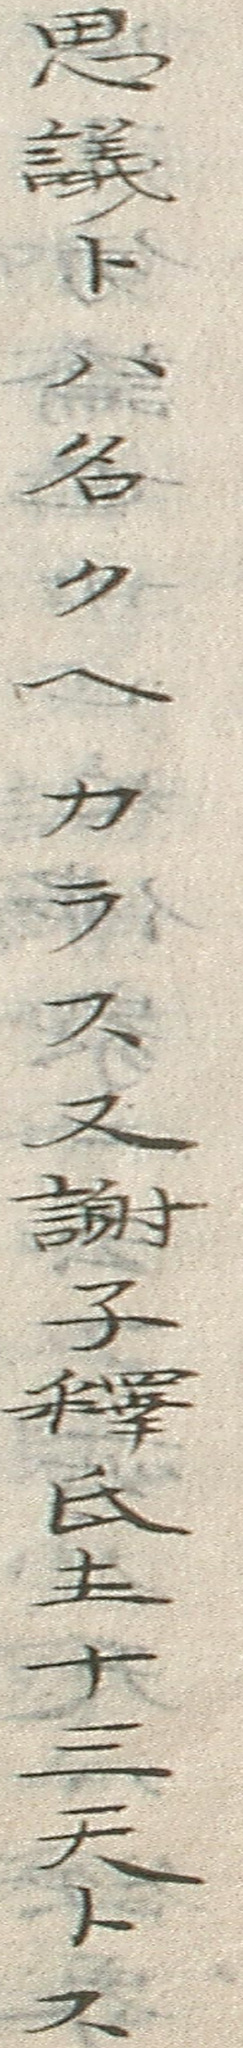思議トハ名クヘカラス又謝子釈氏？十三天トス
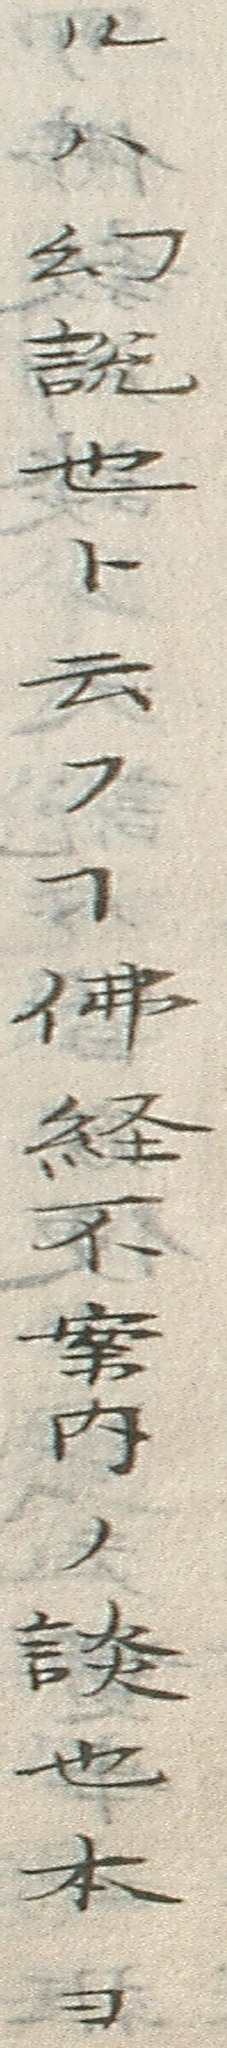ルハ幻説也ト云フコト仏経不案内ノ談也本ヨ

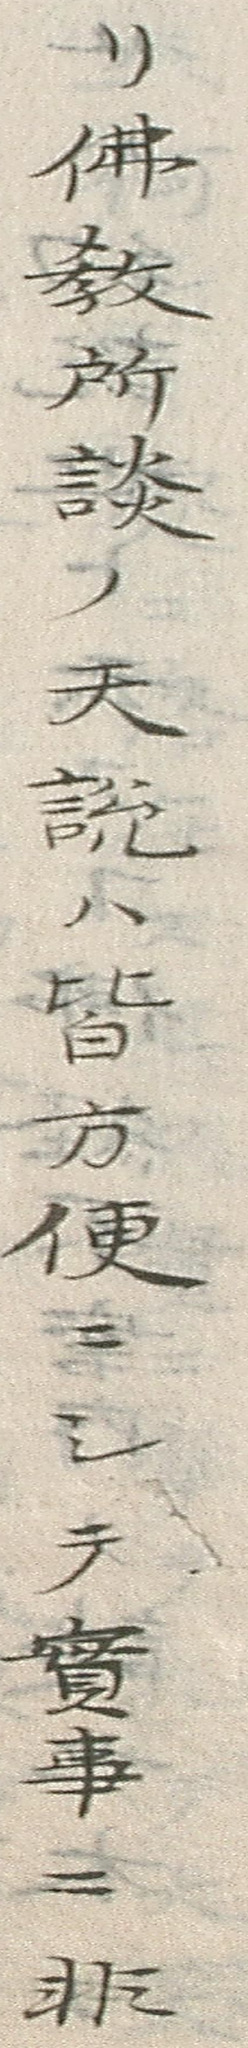リ仏教所談ノ天説ハ皆方便ニシテ実事ニ非
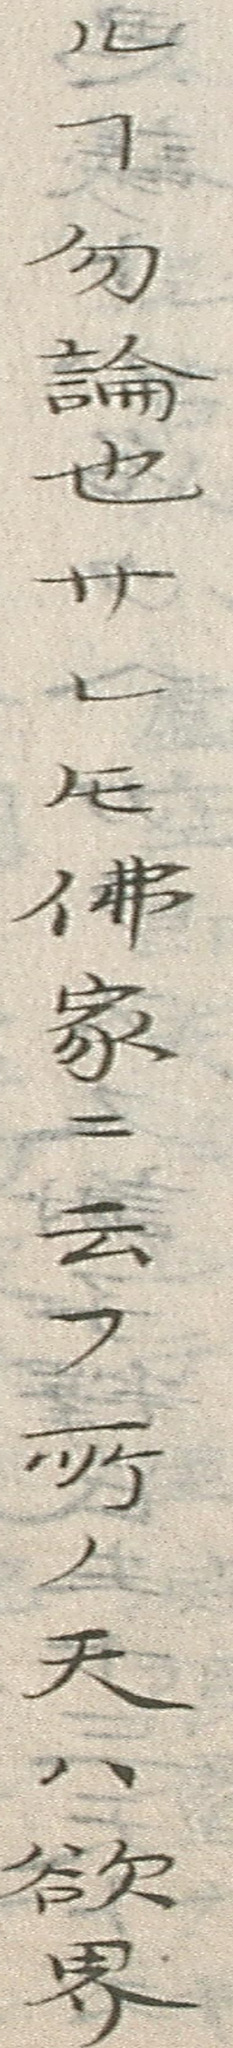ルコト勿論也サレトモ仏家ニ云フ所ノ天ハ欲界
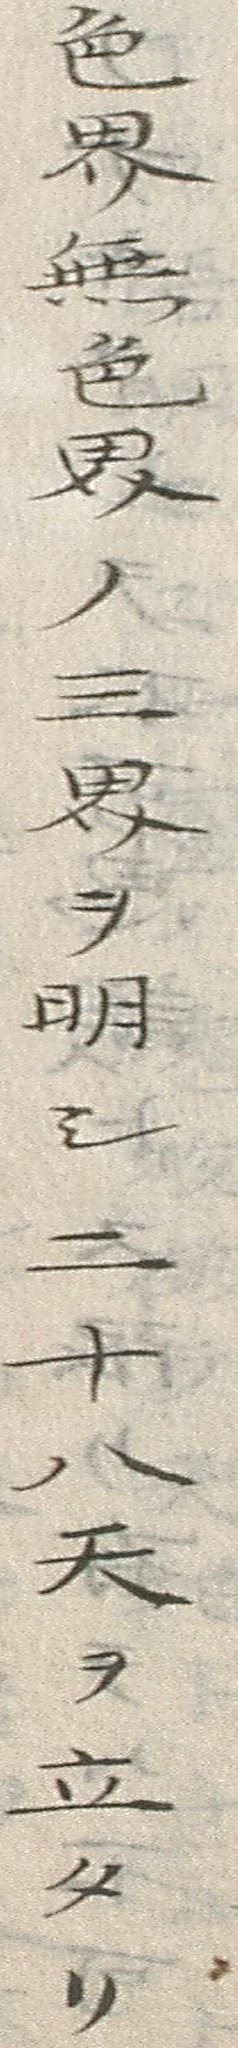色界無色界ノ三界ヲ明シ二十八天ヲ立タリ
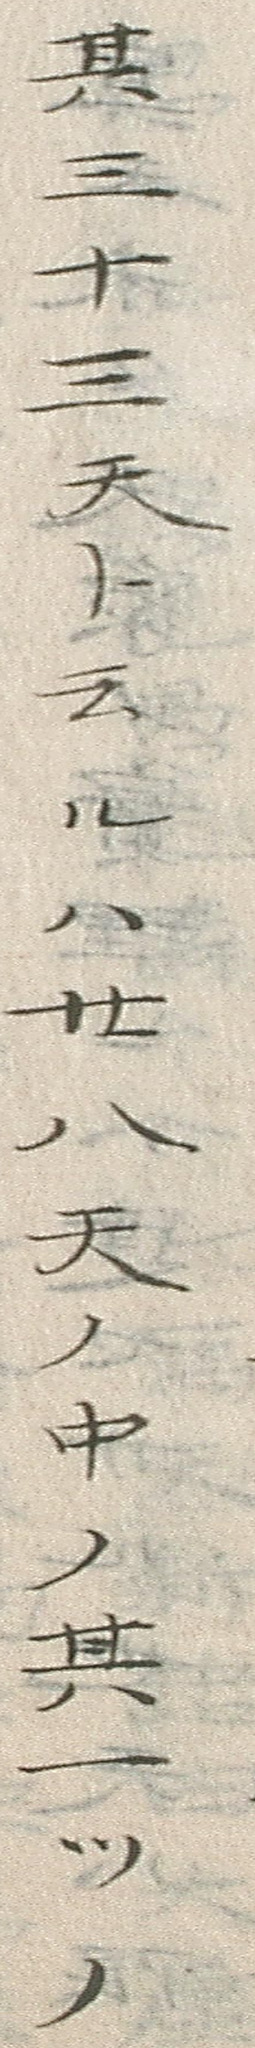其三十三天ト云ルハ廿八天ノ中ノ其一ッノ
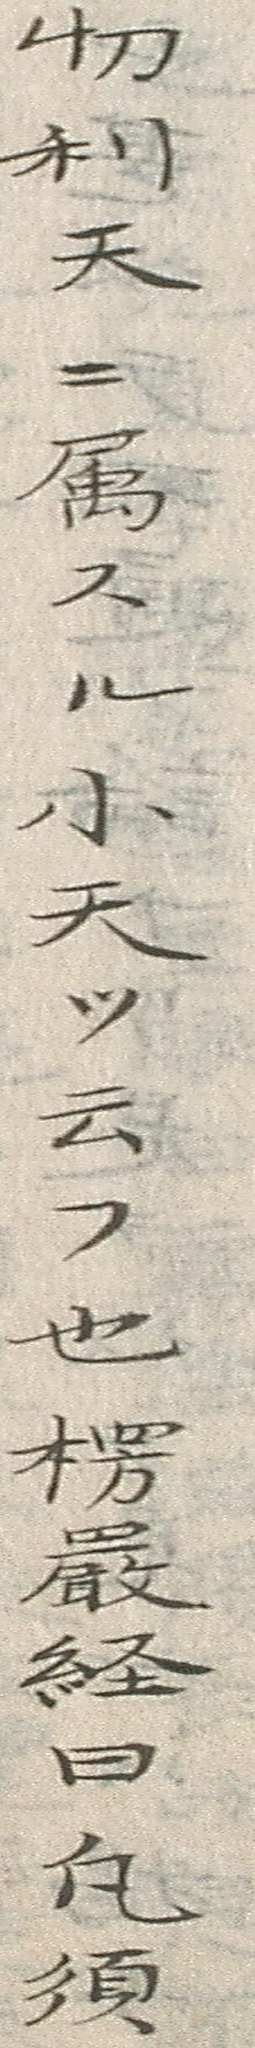忉利天ニ属スル小天ッ云フ也楞巌経曰凡須
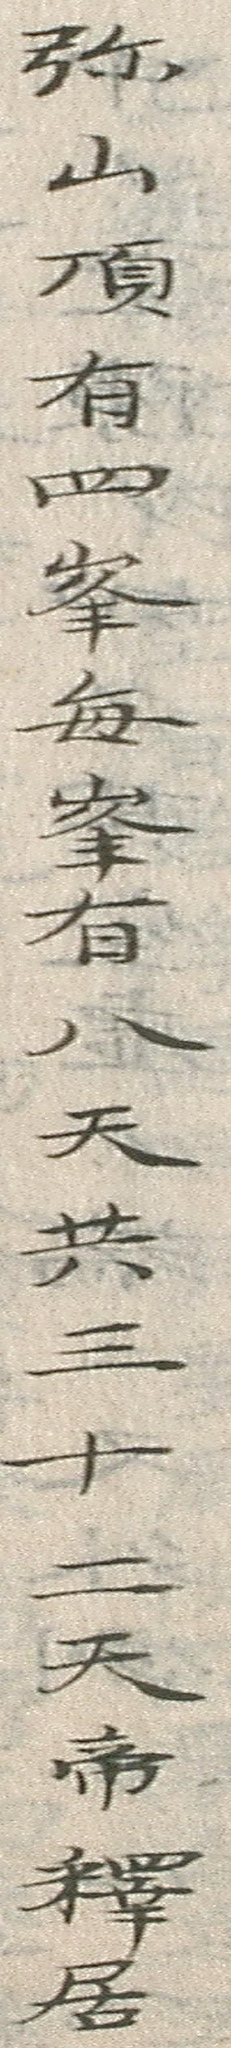弥山頂有四峯毎峯有八天共三十二天帝釈居
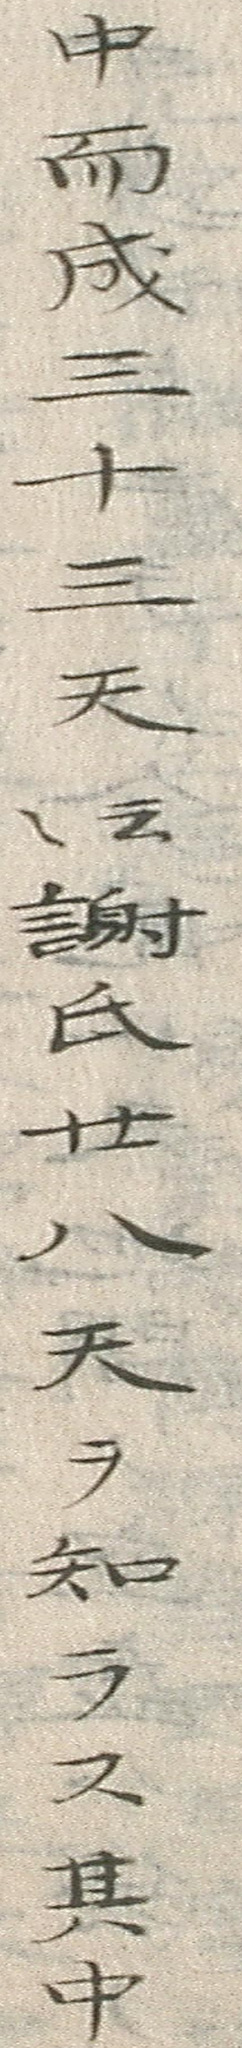中而成三十三天云〻謝氏廿八天ヲ知ラス其中
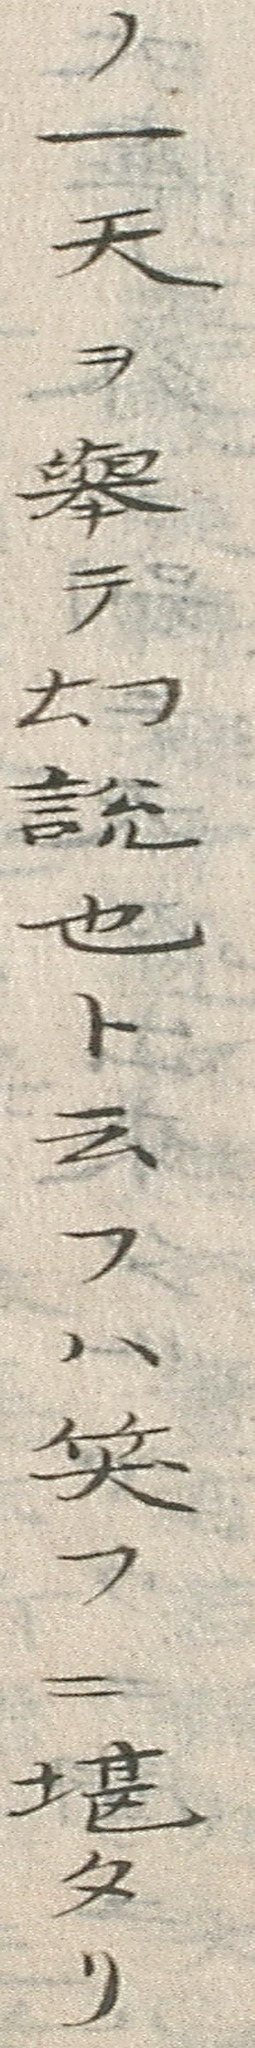ノ一天ヲ挙テ？説也ト云フハ笑フニ堪タリ
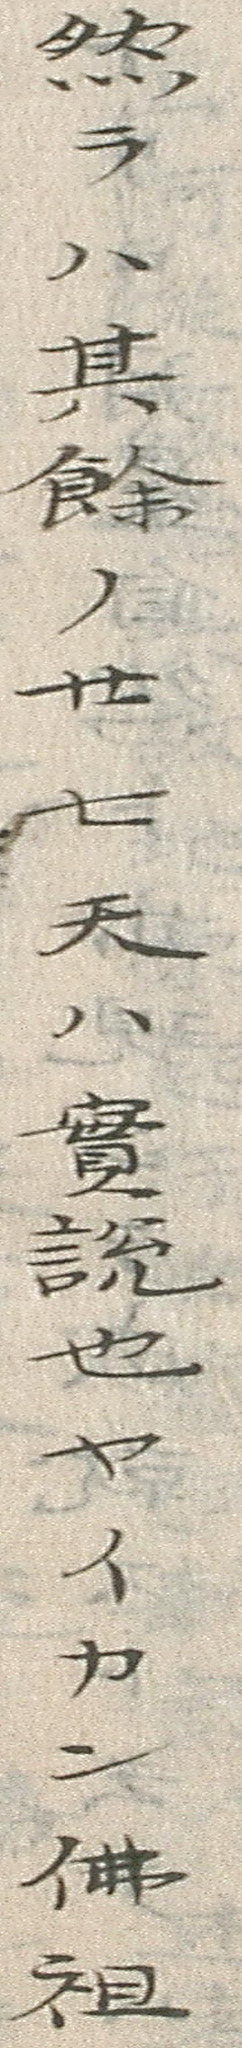然ラハ其余ノ廿七天ハ実説也ヤイカン仏祖
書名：天學略名目羽翼　全
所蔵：東京大学地震研究所図書室 Earthquake Research Institute Library, The University of Tokyo, JAPAN
